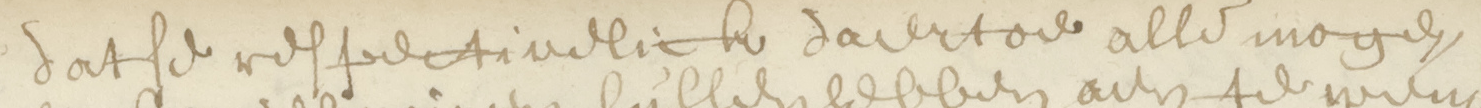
datse respectivelick daertoe alle moge„
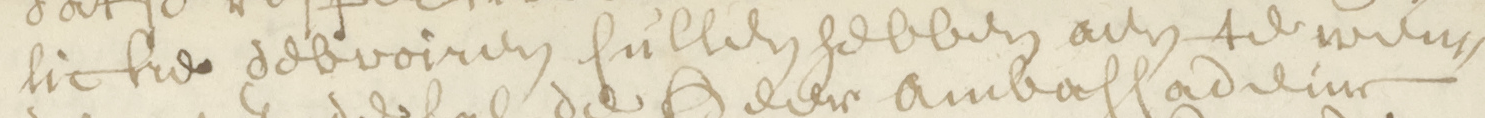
licke debvoiren sullen hebben aen te wen„
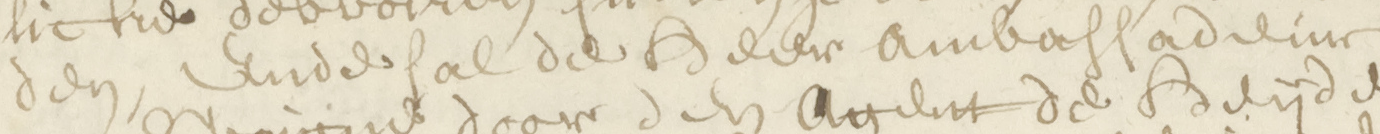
den. Ende sal de Heer Ambassadeur
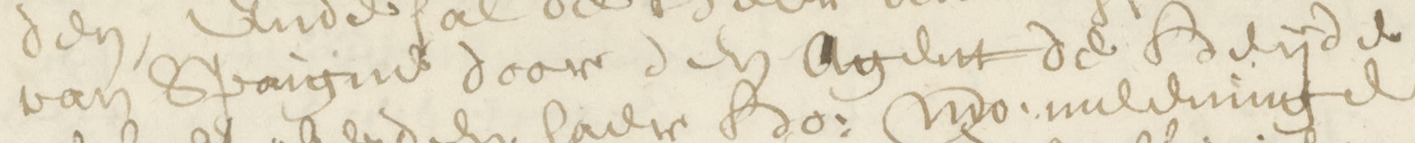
van Spaigne door den Agent de Heijde
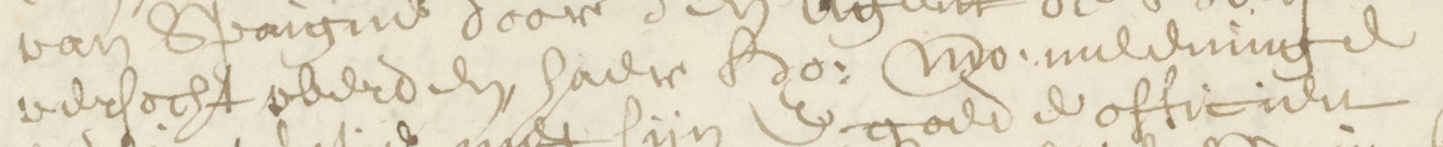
versocht werden, haer Ho:Mo: meeninge
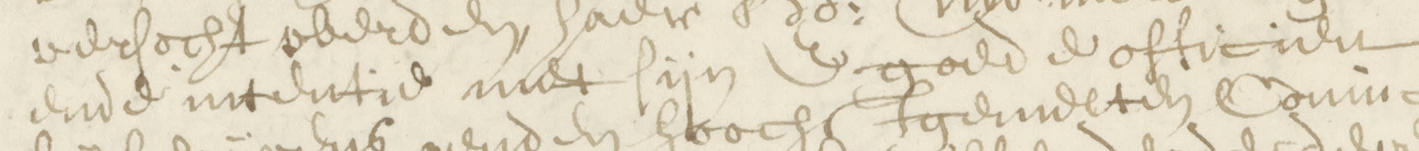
ende intentie met sijn E. goede officien
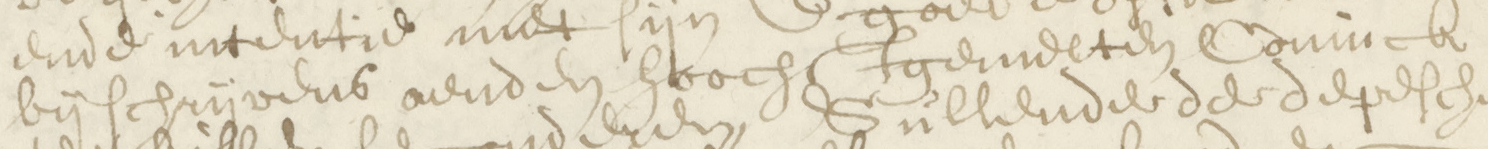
bij schrijvens aenden hoochstgemelten Coninck
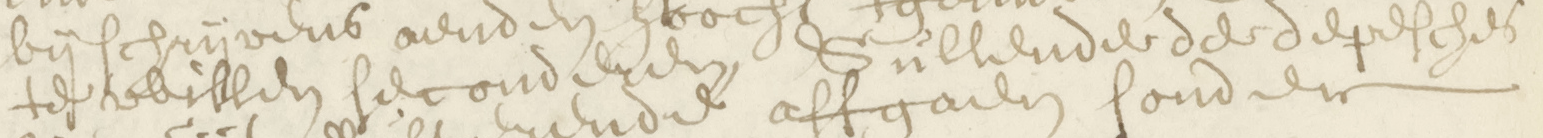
te willen seconderen. Sullende de depesches
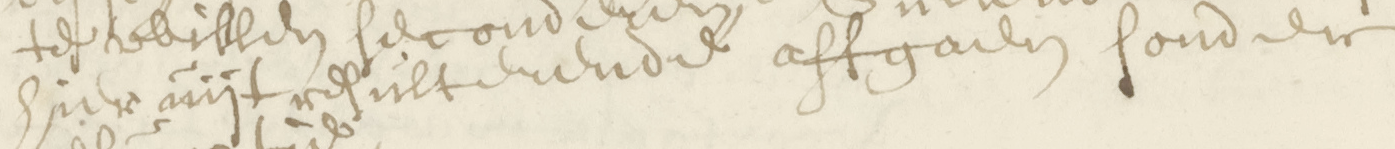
hier uijt resulterende affgaen sonder
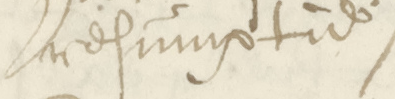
resumptie.
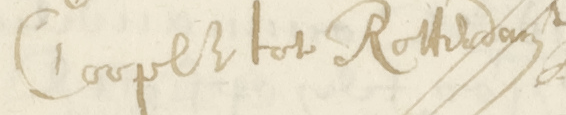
Coopl tot Rotterdam.
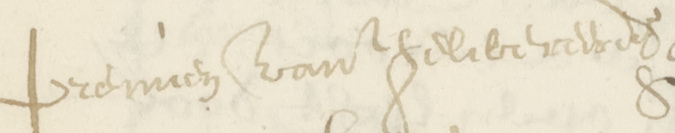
Premien van gelibereerden
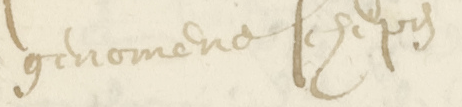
genomene schepen.
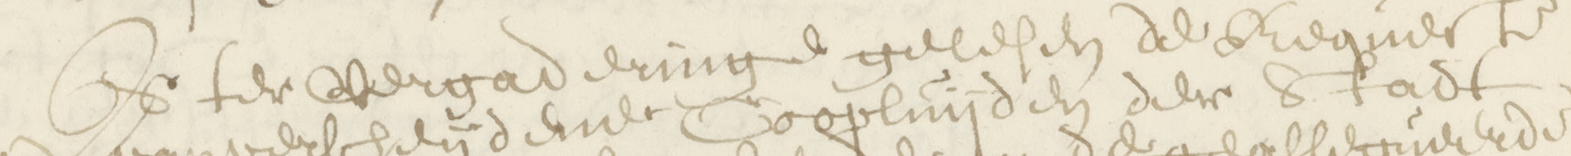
Is ter Vergaderinge gelesen de Requeste
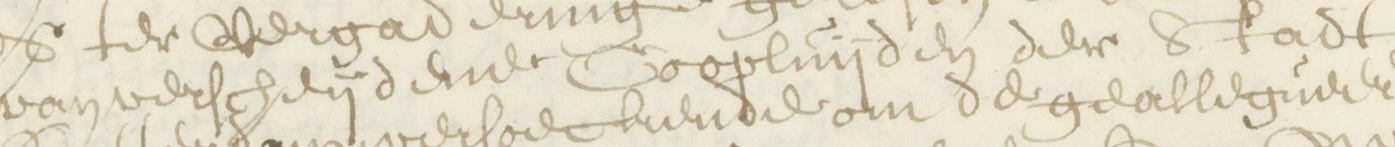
van verscheijdene Coopluijden der Stadt
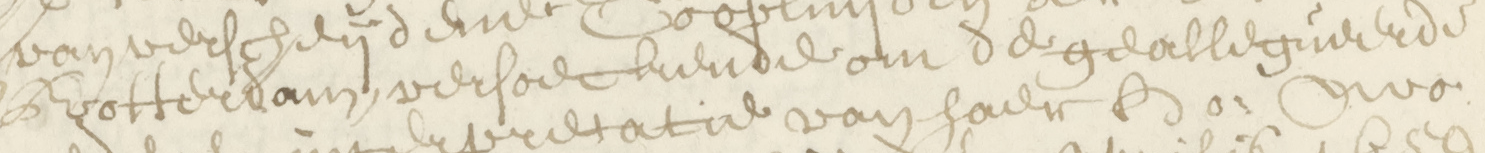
Rotterdam, versoeckende om de geallegueerde
